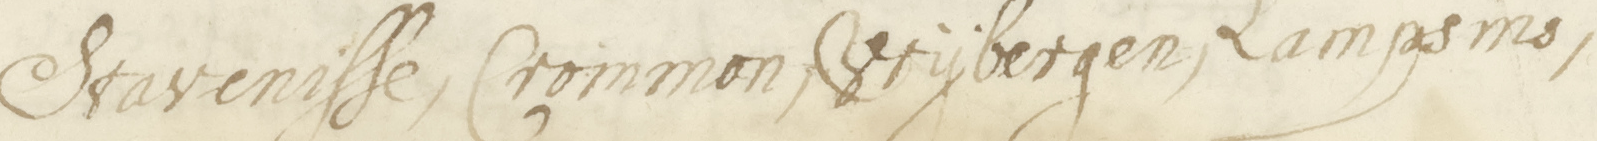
Stavenisse, Crommon, Vrijbergen, Lampsins,
